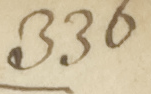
336
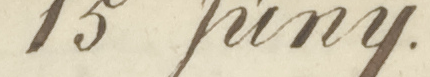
15 Junij
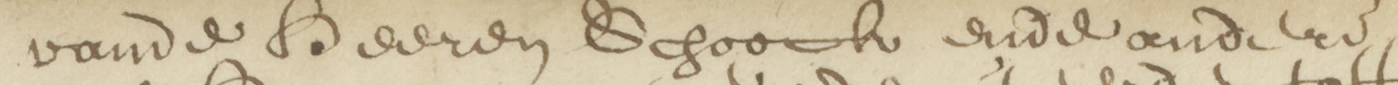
van de Heeren Schoock ende andere
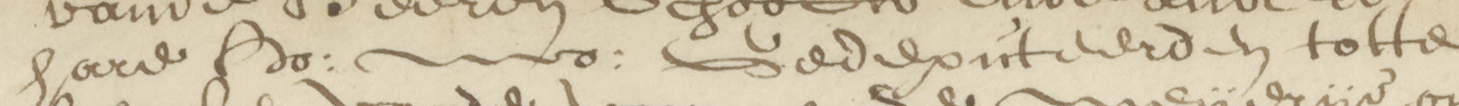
hare Ho: Mo: Gedeputeerden totte
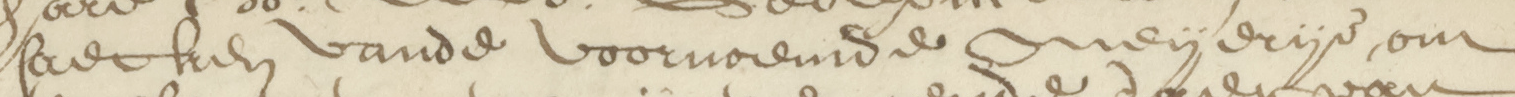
saecken vande voornoemde Meijerije, om
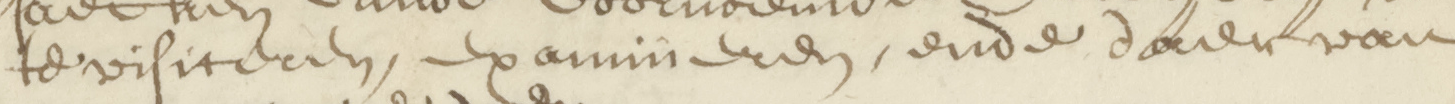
te visiteren, examineren, ende daervan
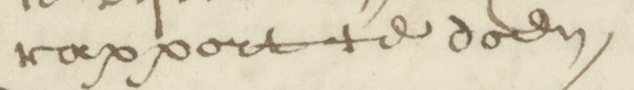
rapport te doen.
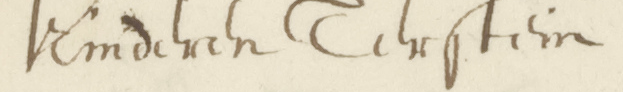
Kinderen Terstein
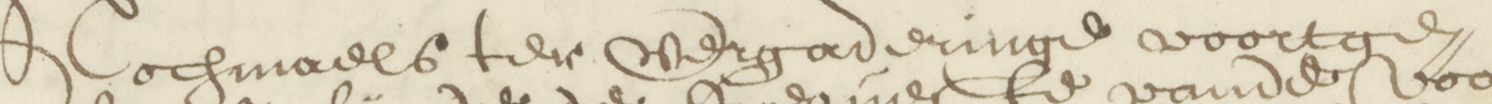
Nochmaels ter Vergaderinge voortge„
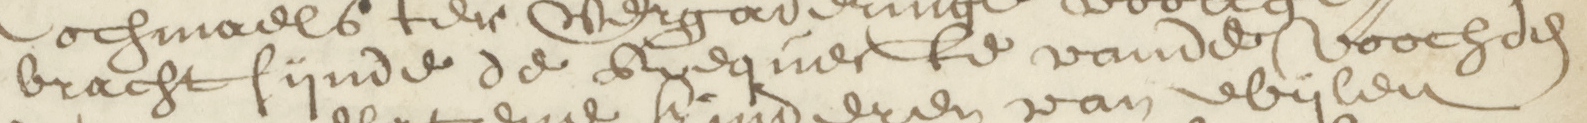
bracht sijnde de Requeste vande voochde
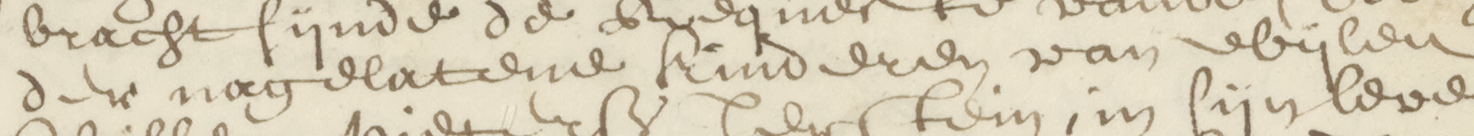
der nagelatene kinderen van wijlen
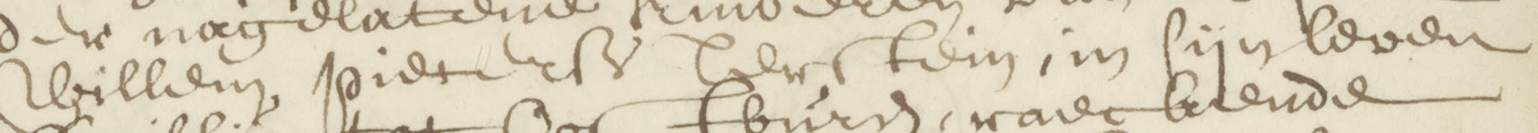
Willem Pietersz Terstein, in sijn leven
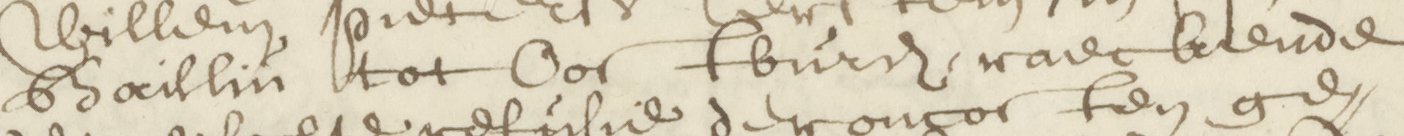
Bailliu tot Oostburen, raeckende
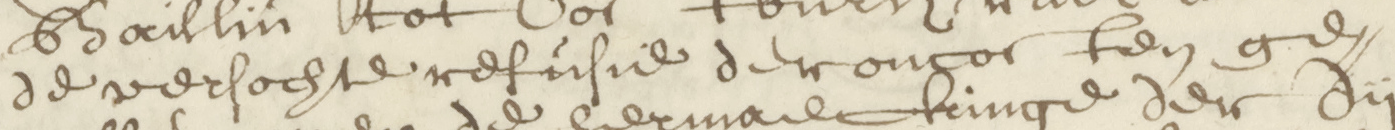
de versochte refusie der oncosten ge„
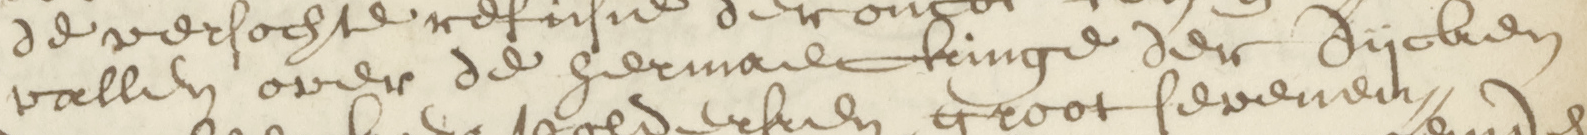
vallen over de hermaeckinge der dijcken
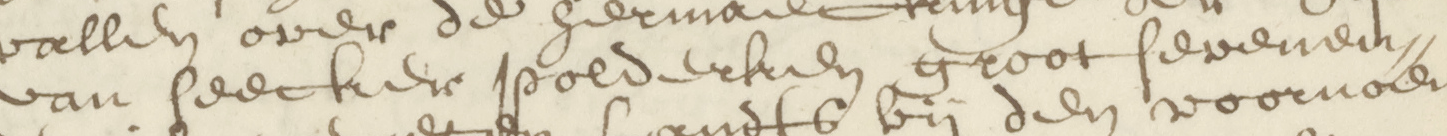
van seecker polderken groot sevenen„
